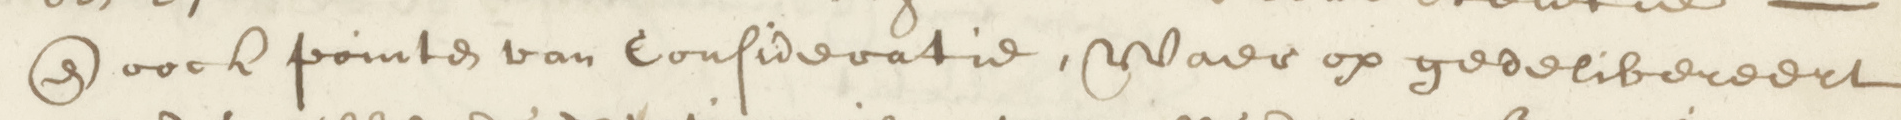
& oock pointen van Consideratie. Waer op gedelibereert
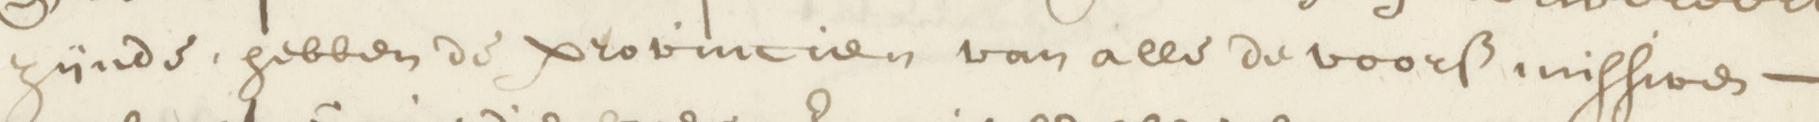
zijnde, hebben de provincien van alle de voors missiven -
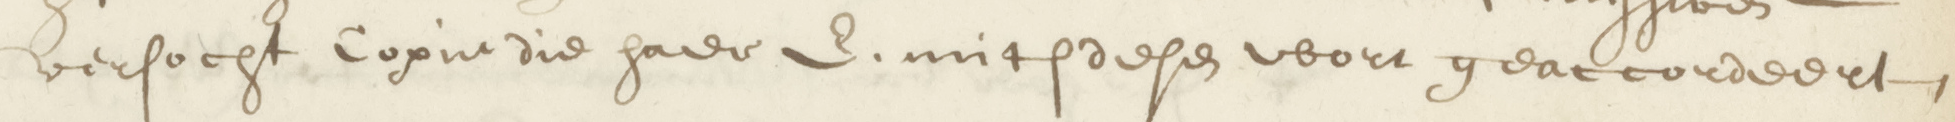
versocht Copie die haer E. mitsdesen wort geaccordeert.
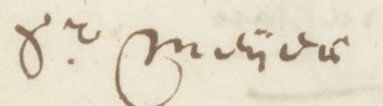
Sr. Meijer
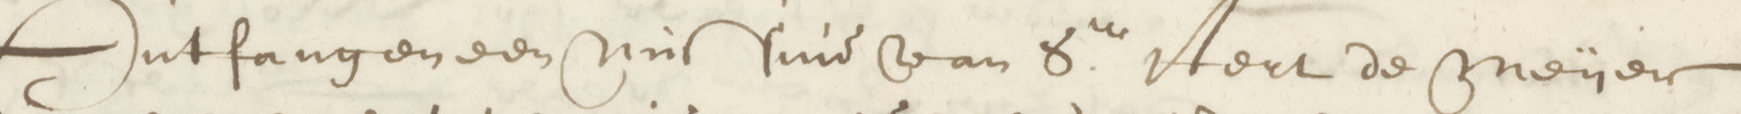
Ontfangen een Missive van Sr. Aert de Meijer,
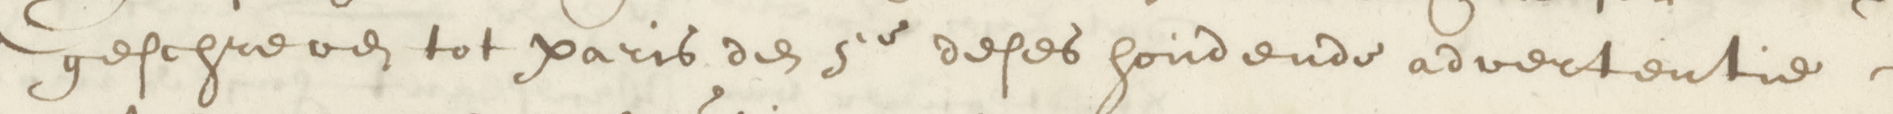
geschreven tot paris den 5e deses houdende advertentie,
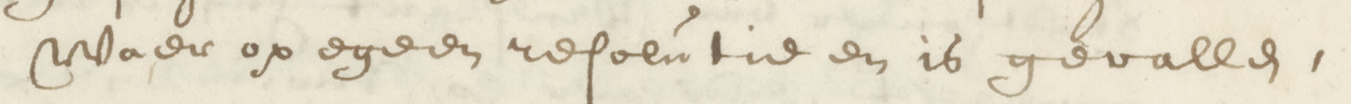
Waer op egeen resolutie en is gevallen.
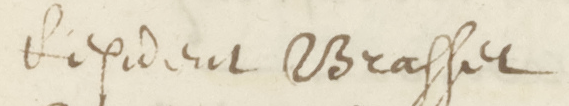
Resident Brasset
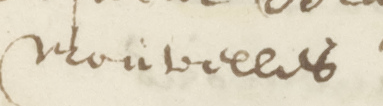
Nouvelles
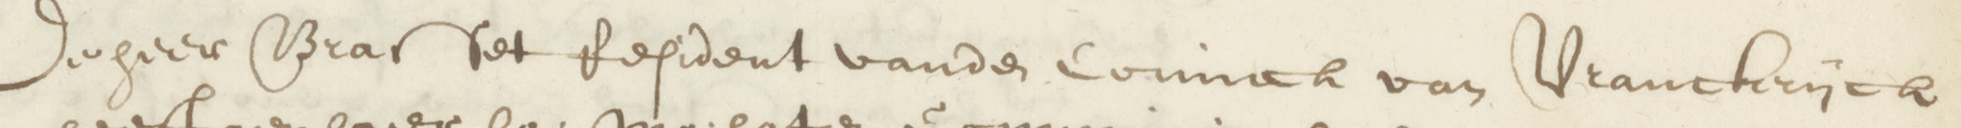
De heer Brasset Resident vanden Coninck van Vranckrijck
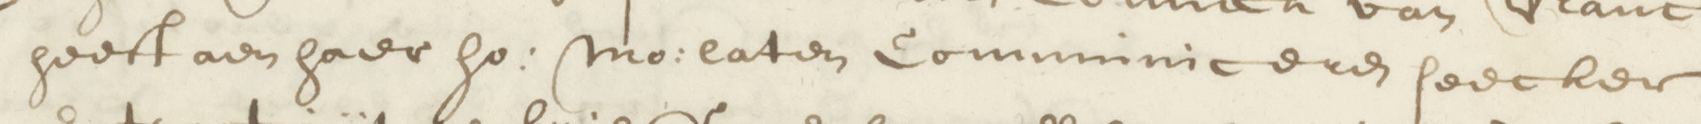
heeft aen haer Ho:Mo: laten Communiceren seecker
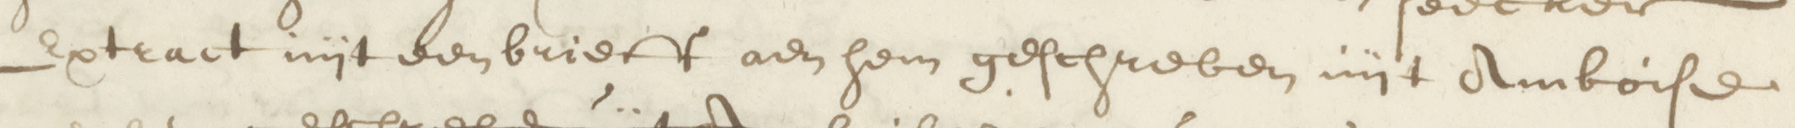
Extract uijt een brieff aen hem geschreven uijt Amboise
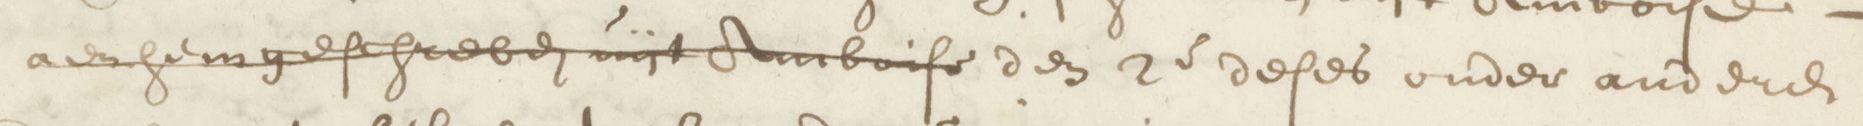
aen hem geschreven uijt Amboise den 2e deses onder anderen
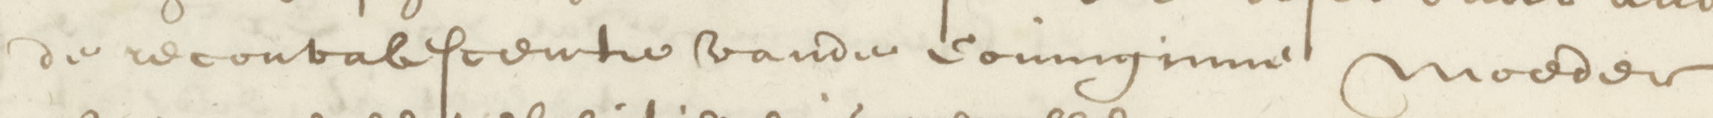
de reconvalescente vande Coninginne Moeder
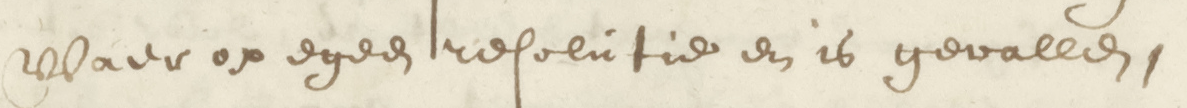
Waer op egeen resolutie en is gevallen.
